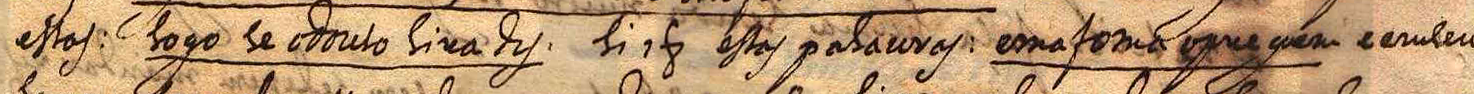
estas: logo se o douto lira dis li 18 estas palauras e mafoma o preguem e em seu
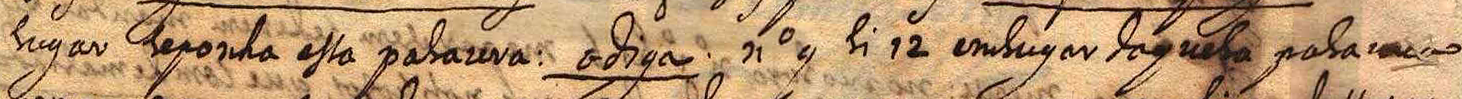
lugar se ponha esta palaura: o diga. no 9 li 12 em lugar daquela palaura
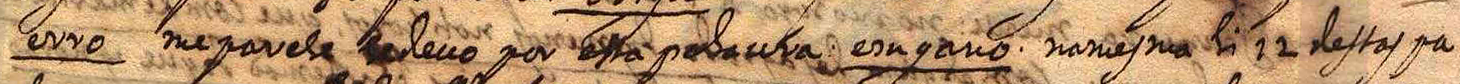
erro me parese se deue por esta palaura emgano. na mesma li 12 destas pa
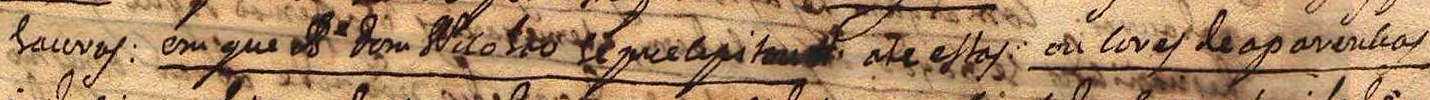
lauras: em que o Pe Dom Nicolao se precipitou tt. ate estas: ou cores de aparencias
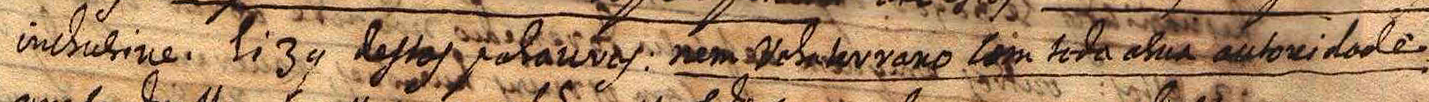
inclusiue. li 39 destas palauras: nem Velaterrano com toda a sua autoridade
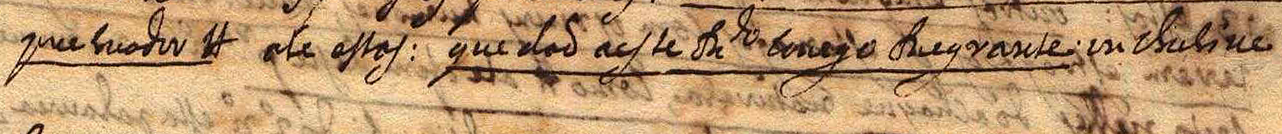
presuadio tt ate estas: que daõ a este Rdo conego Regrante inclusiue.
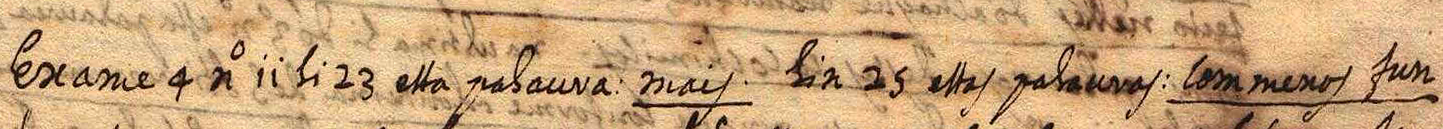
Exame 4 no 11 li 23 esta palaura: mais. li n 25 estas palauras: com menos fun
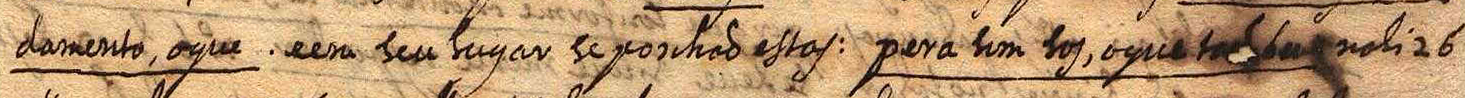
damento, o que. e em seu lugar se ponhaõ estas: pera sim sos, o que taõbem na li 26
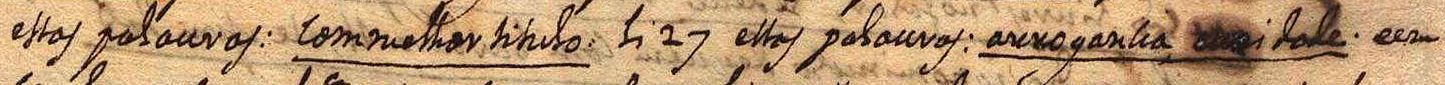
estas palauras: com melhor titulo. Li 27 estas palauras: arrogancia, _idade. e em
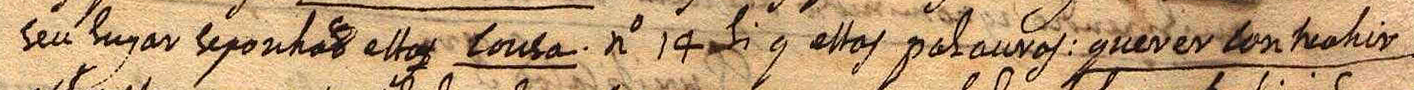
seu lugar se ponhaõ esta cousa. no 14 li 9 estas palauras: querer contrahir
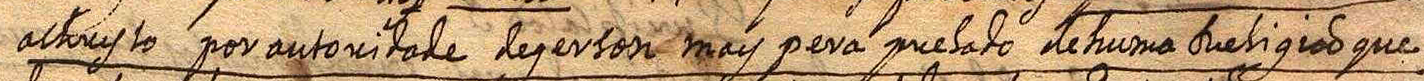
a christo por autoridade de gerson mais pera prelado de huma Religiaõ que
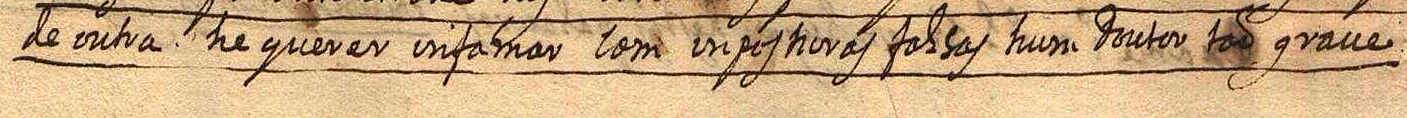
de outra. he querer infamar com inposturas falsas hum Doutor taõ graue
